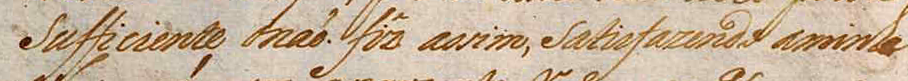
sufficiente o naõ fiz assim, satisfazendo a minha
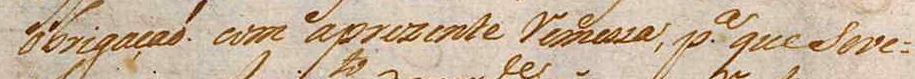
obrigaçaõ com a prezente Remessa, p.a que se ve
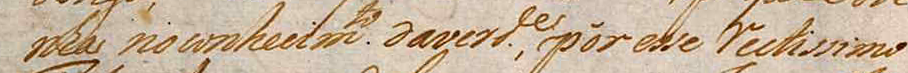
nha no conhecim.to da verd.e por esse rectissimo
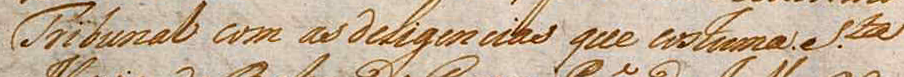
Tribunal com as deligencias que costuma. S.ta
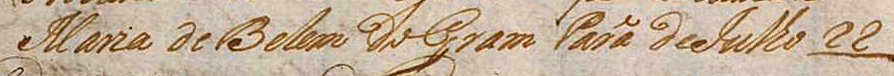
Maria de Belem do Gram Pará de Iulho 22
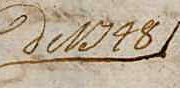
de 1748
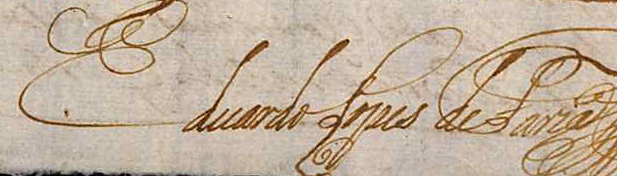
Eduardo Lopes de Faria
